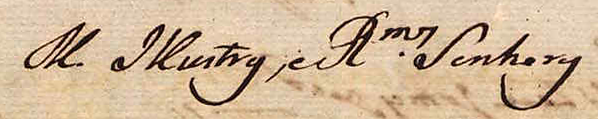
M. Illustres, e R.mos Senhores
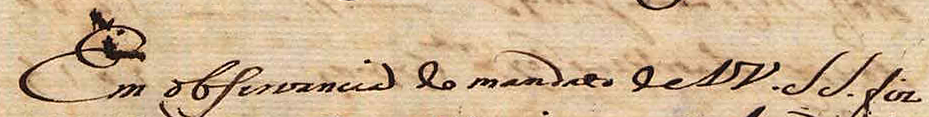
Em observancia do mandato de VV. SS. fiz
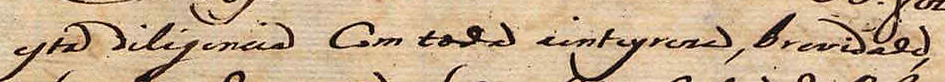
esta diligencia Com toda a inteyreza, brevidade,
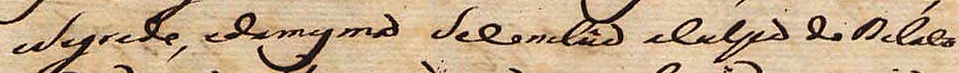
e Segredo, e da mesma se conclûa a Culpa do Delato
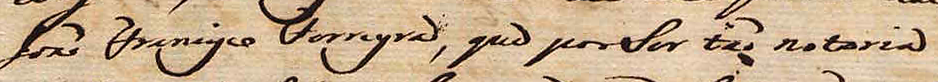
Joaõ Francisco Ferreyra, que por Ser taõ notoria
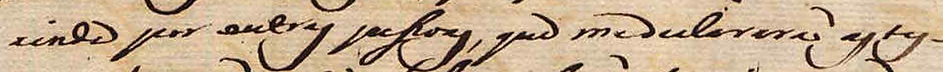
ainda por outras pessoas, que me declararaõ as tes
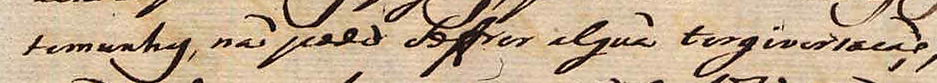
temunhas, naõ pode soffrer alguā tergiversaçaõ,
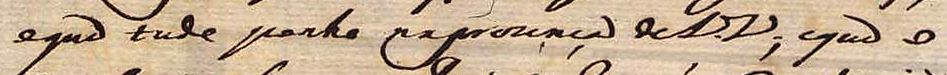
e que tudo ponha na prezença de VV., e que o
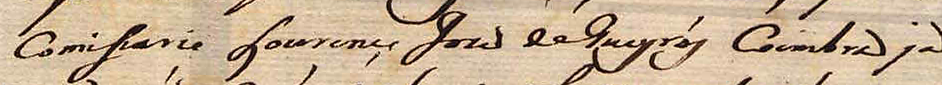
Comissario Lourenço Joze de Queyrós Coimbra ja
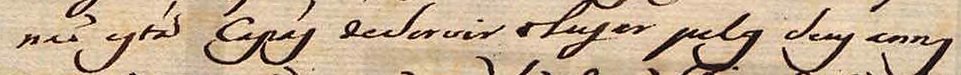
naõ está Capás de servir o Lugar pelo seus annos
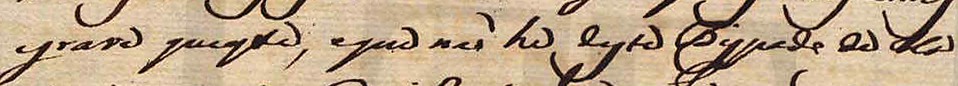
e grave que esta, e que naõ he deste Bispado de Ma
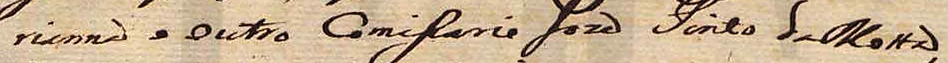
rianna o outro Comissario Joze Pinto da Motta,
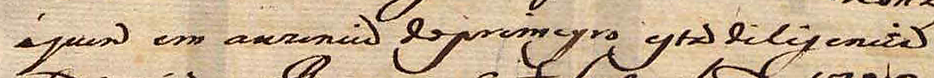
a quem em auzencia do primeyro esta diligencia
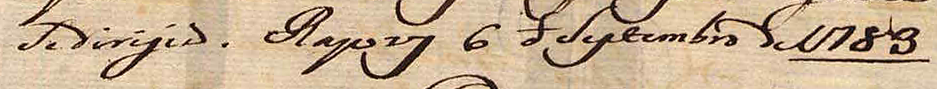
se dirigia. Rapozos 6 d̄ Septembro de 1783
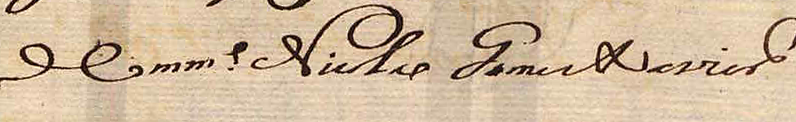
O Comm.o Nicolao Gomes Xavier
